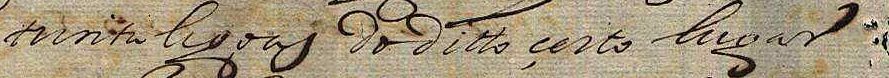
trinta legoas do ditto certo lugar
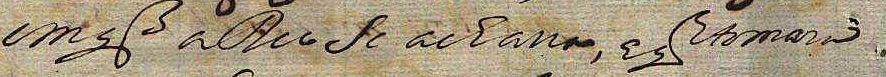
em q̄ a Ree se achaua, E q̄ tomara
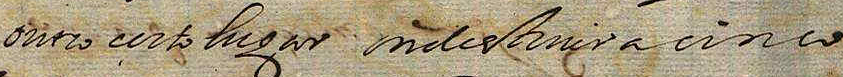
outro certo lugar onde estiuera cinco
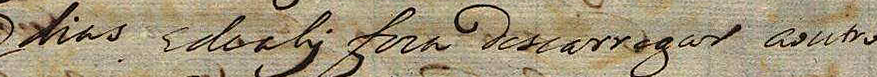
dias E de aly fora descarregar a outro
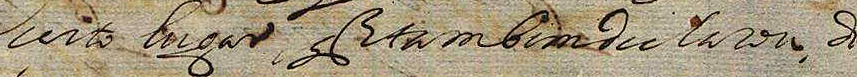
certo lugar, q̄ tambem declarou, di
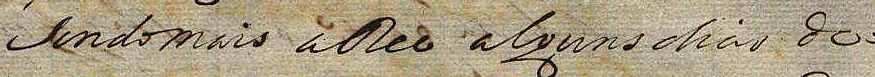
sendo mais a Ree alguns dias de
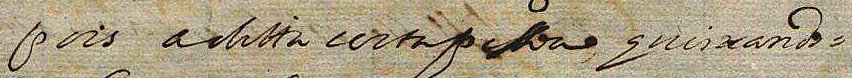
pois a ditta certa pessoa, queixando
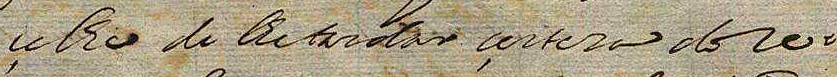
celhe de lhe tardar certeza do re
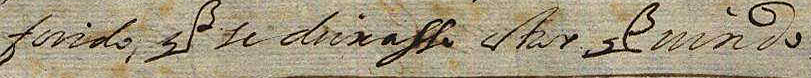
ferido, q̄ se deixasse Estar q̄ uindo
